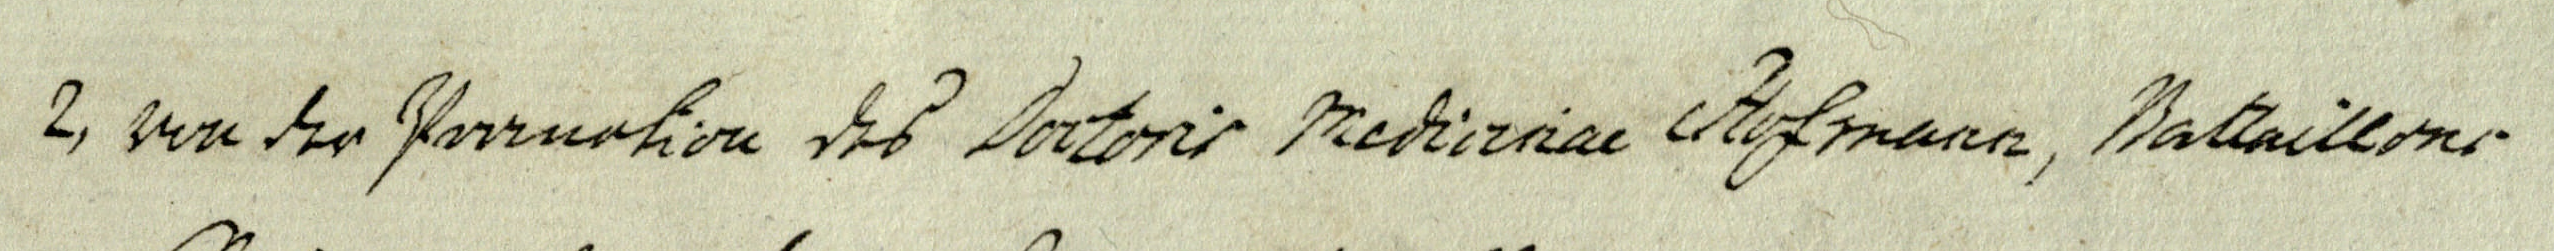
2, von der Promotion des Doctoris Medicinae Hofmann, Battaillons
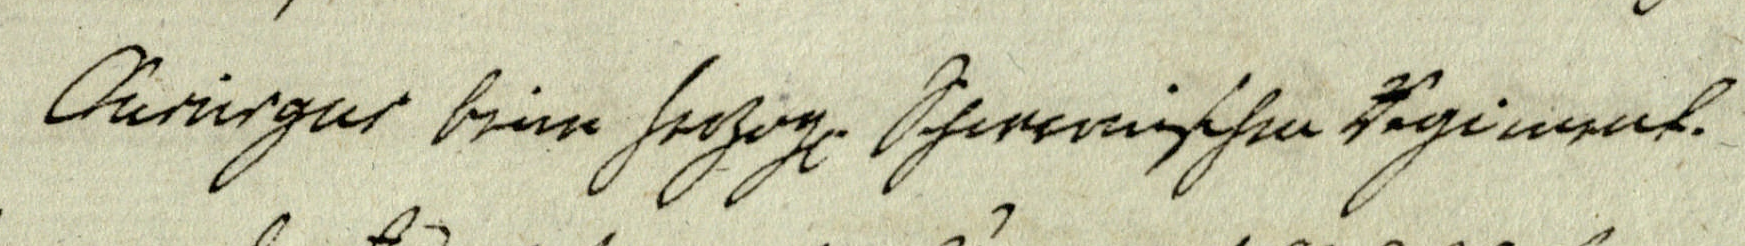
Chirurgus beim herzogl. Schwedischen Regiment.
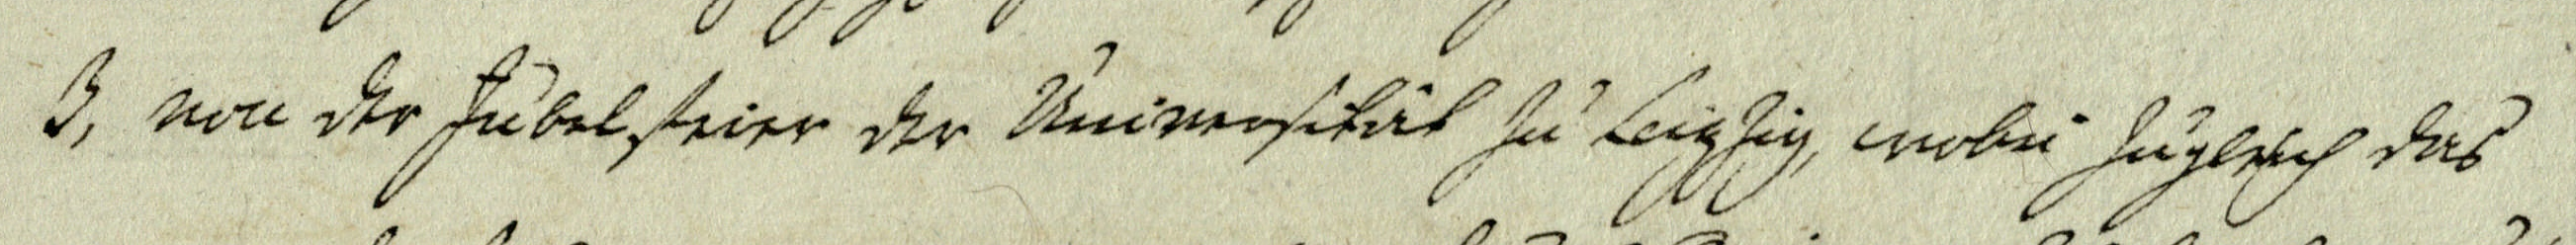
3, von der Jubelfeier der Universität zu Leipzig, werden zugleich das
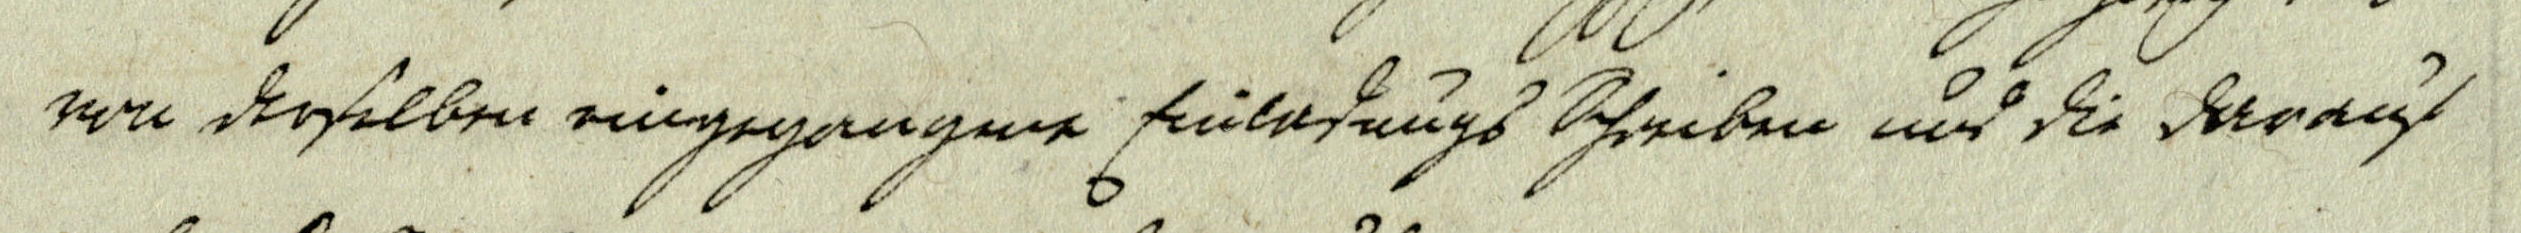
von derselben eingegangene Einladungs Schreiben und die darauf
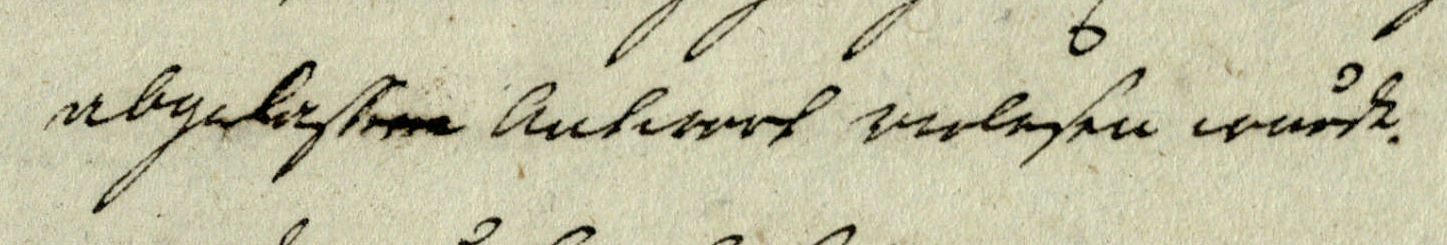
abgelassene Antwort verlesen wurde.
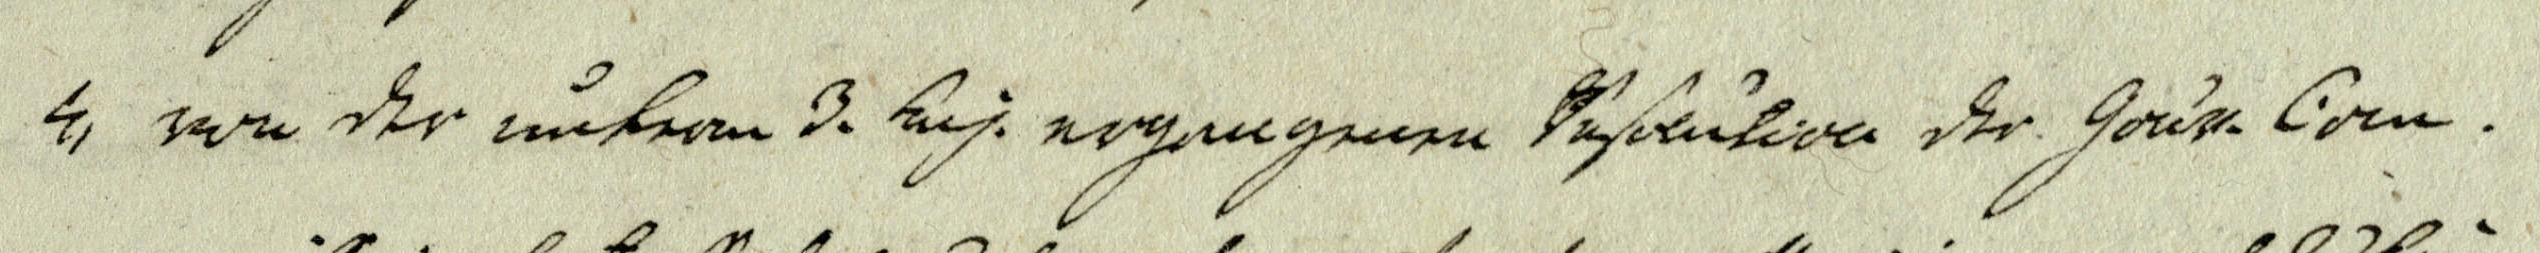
4, von der unterm 3. huj. ergangenen Resolution der Gouv. Com¬
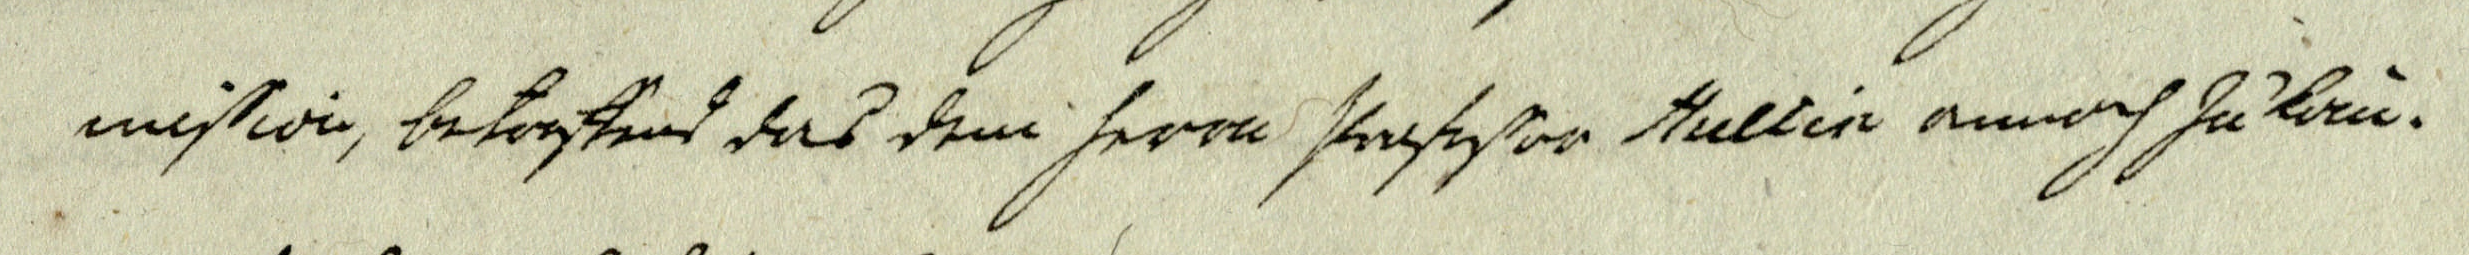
mission, betreffend das dem Herrn Professor Hultén annoch zu kom¬
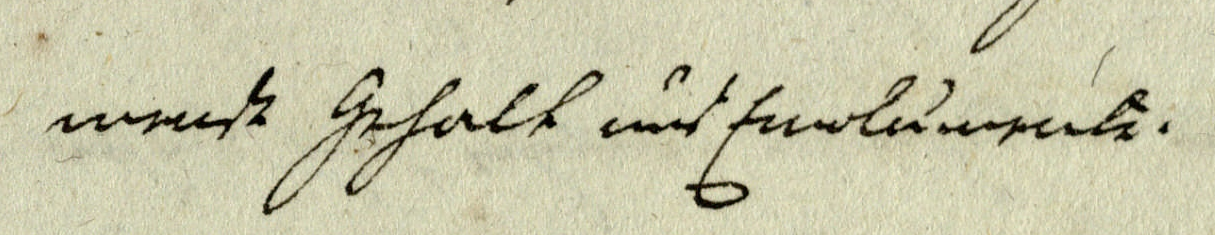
mende Gehalt und Emolumente.
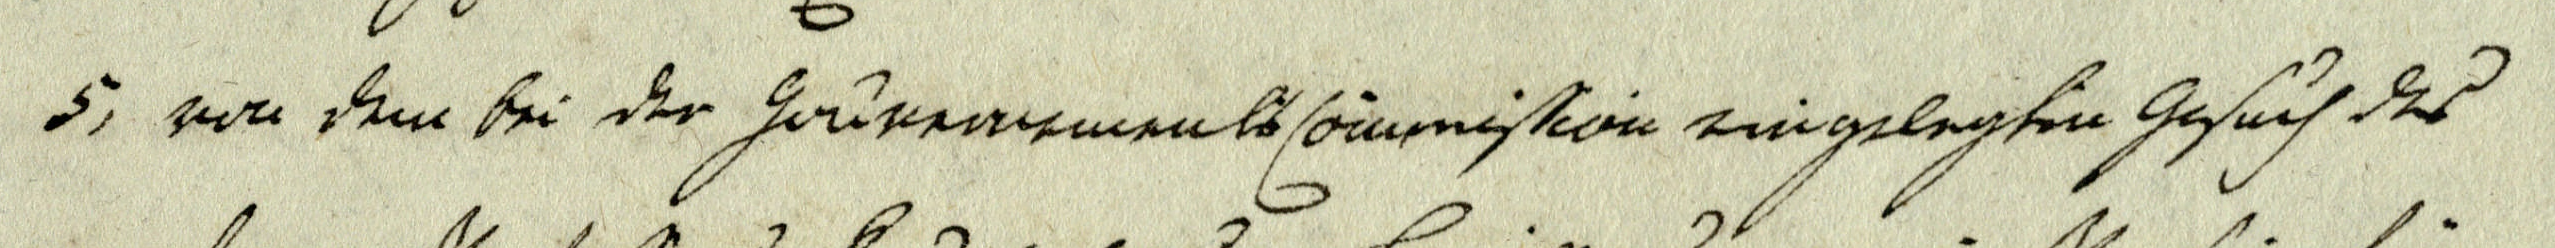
5, von dem bei der Gouvernements Commission eingelegten Gesuch des
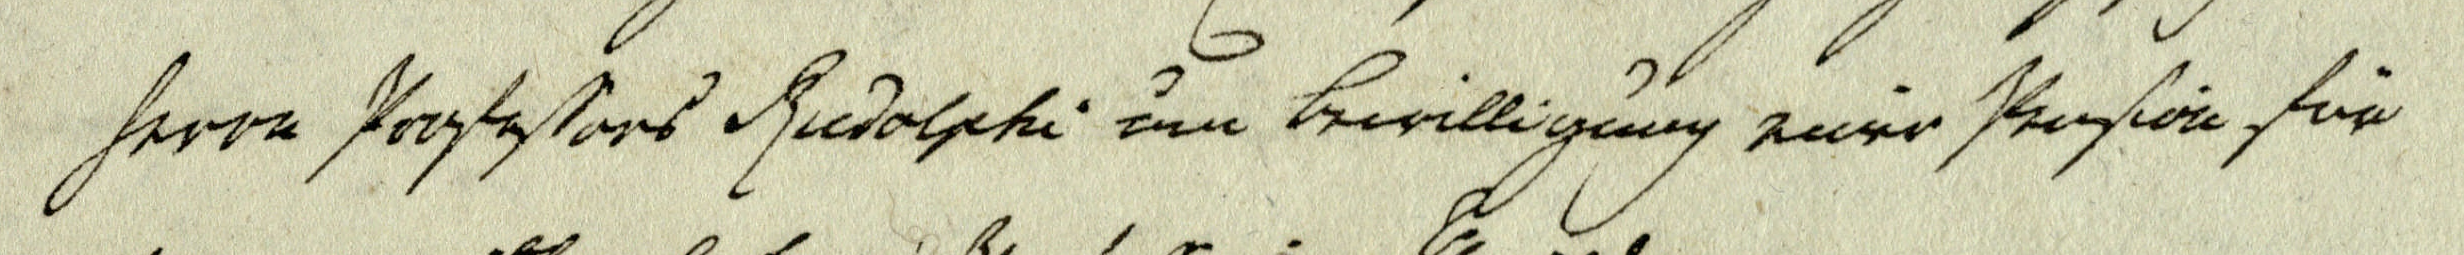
Herrn Professors Rudolphi um Bewilligung einer Pension für
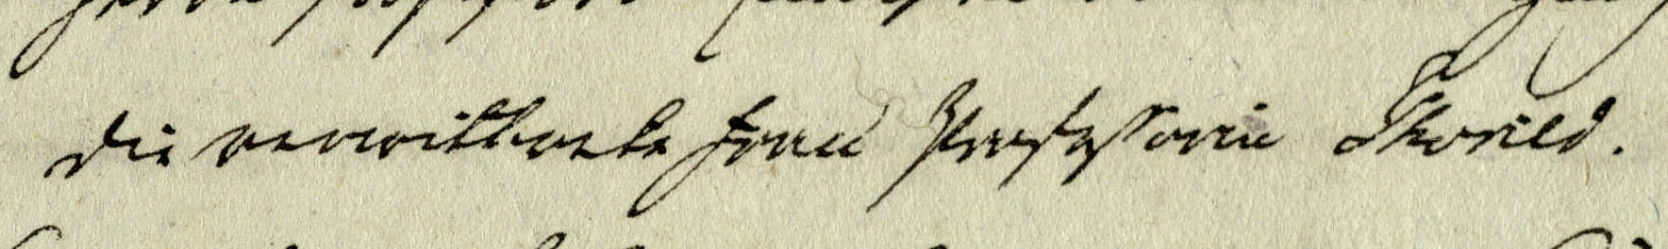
die verwittwete Frau Professorin Thorild.
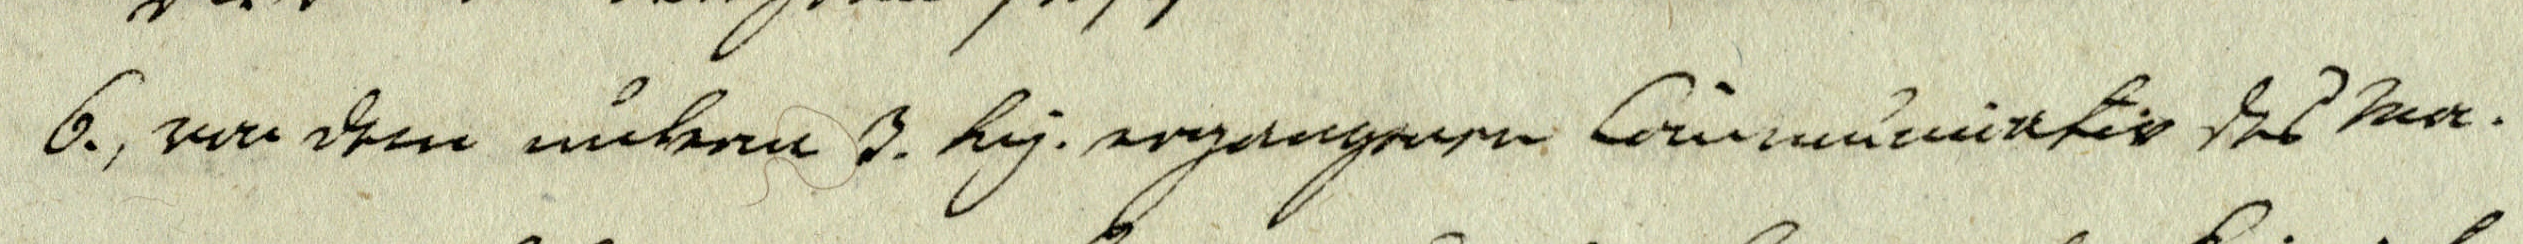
6., von dem unterm 3. huj. ergangenen Communicativ des Ma¬
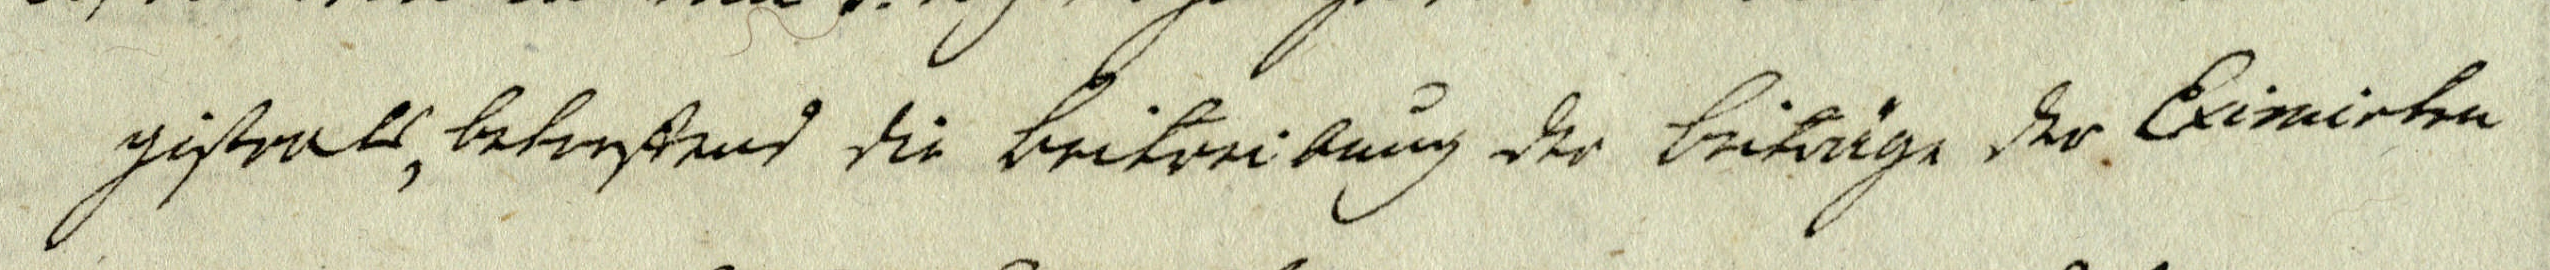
gistrats, betreffend die Beitreibung der Beiträge der Eximirten
